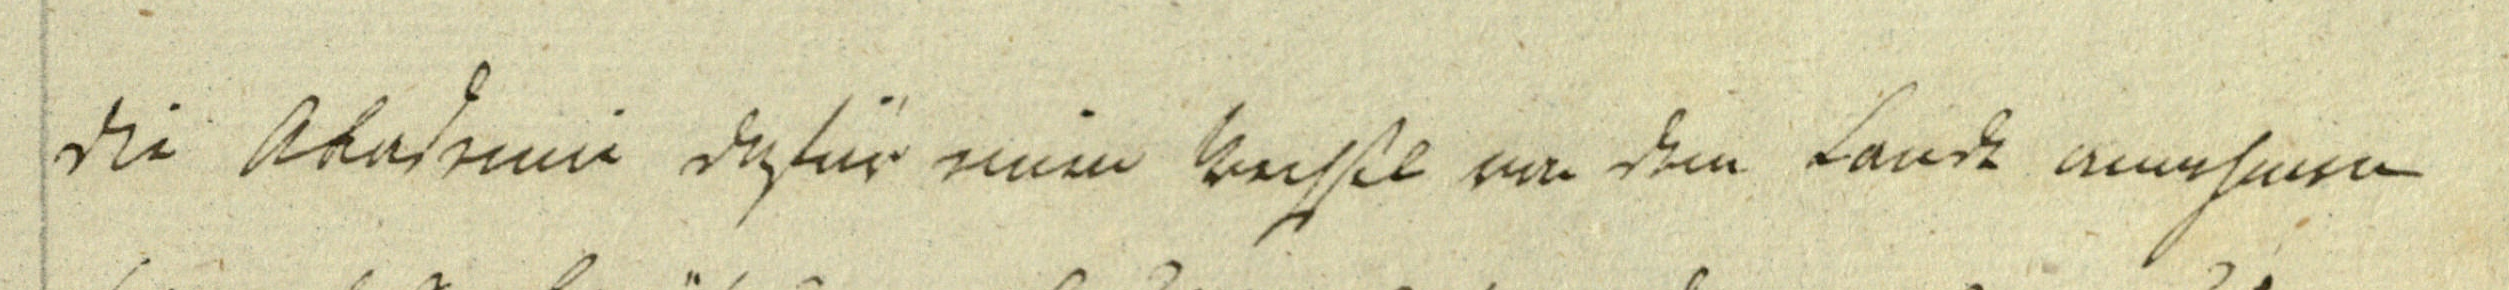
die Akademie dafür einen Wechsel von dem Lande annehmen
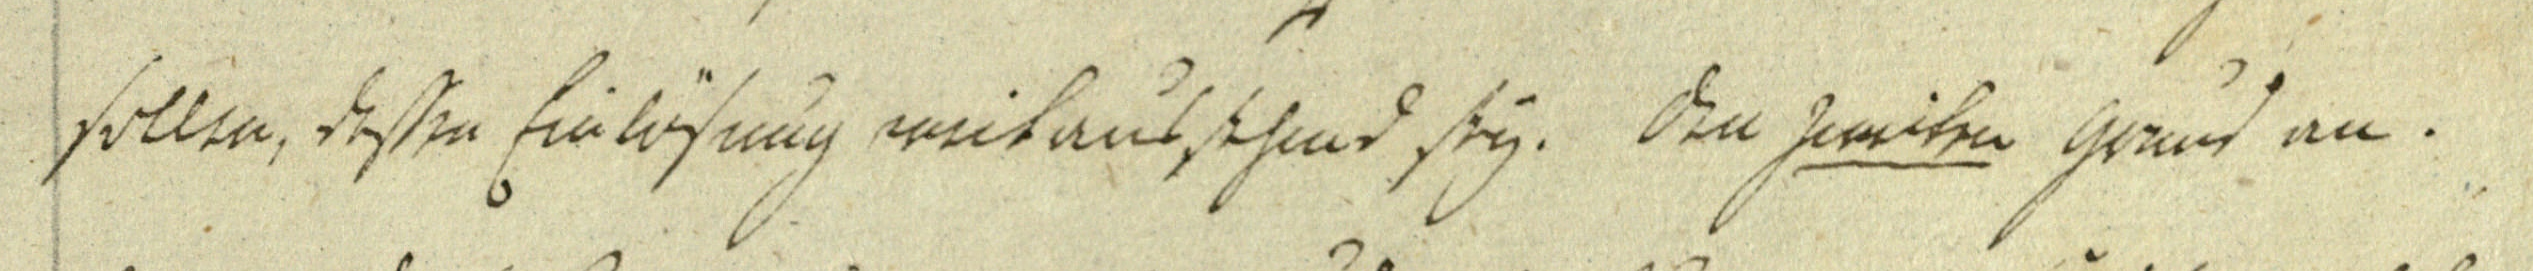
sollen, dessen Einlösung weit aussehend seÿ. Den zweiten Grund an¬
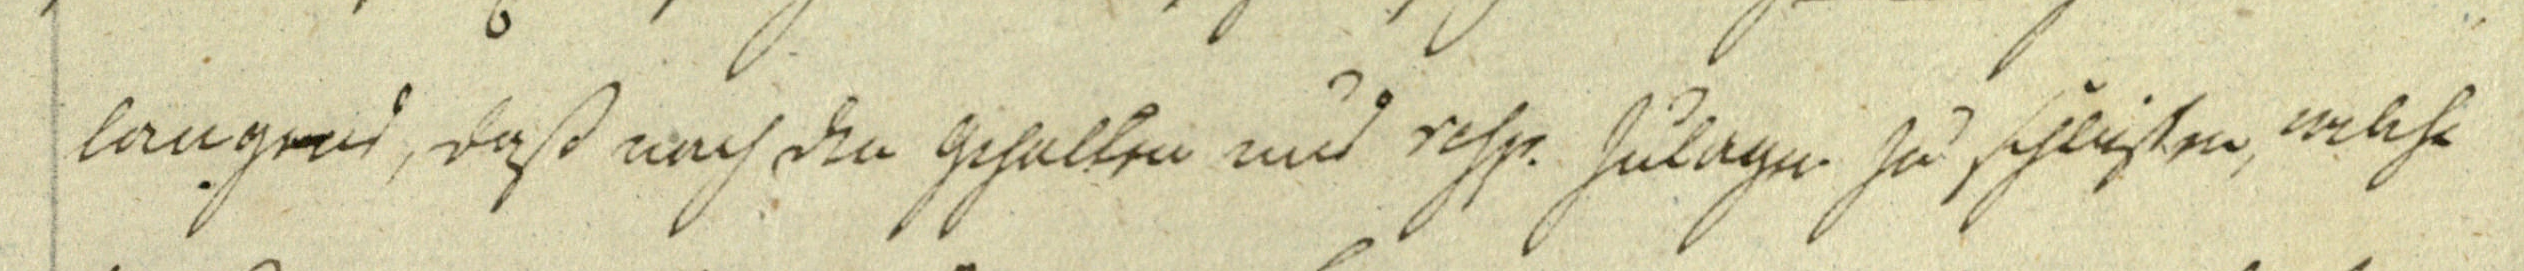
langend, daß nach den Gehalten und resp. Zulagen zu schliessen, welche
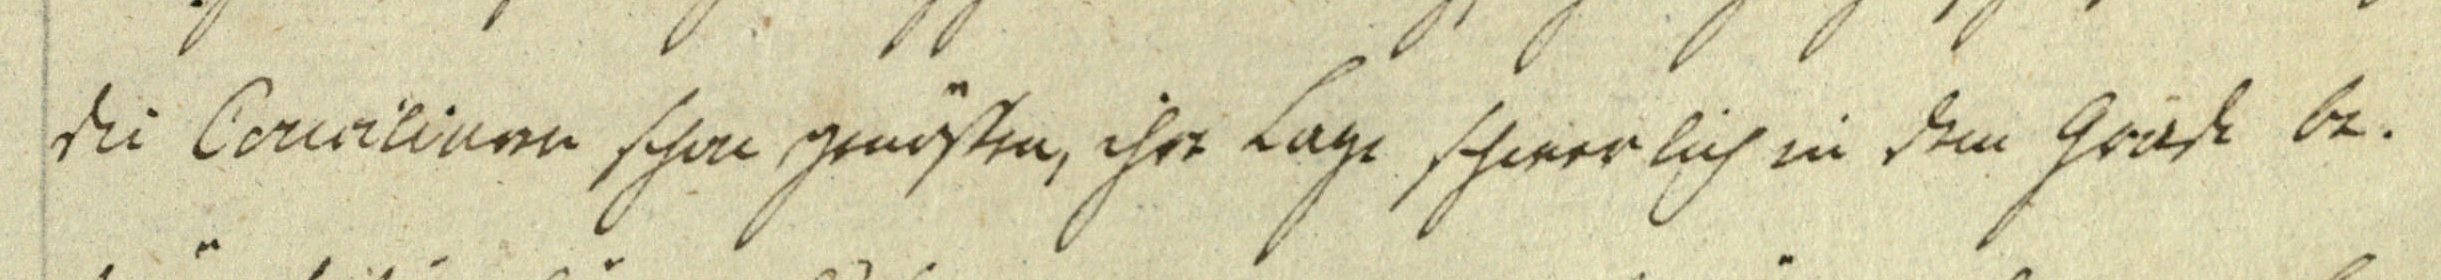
die Conciliaren schon genössen, ihre Lage schwerlich in dem Grade be¬
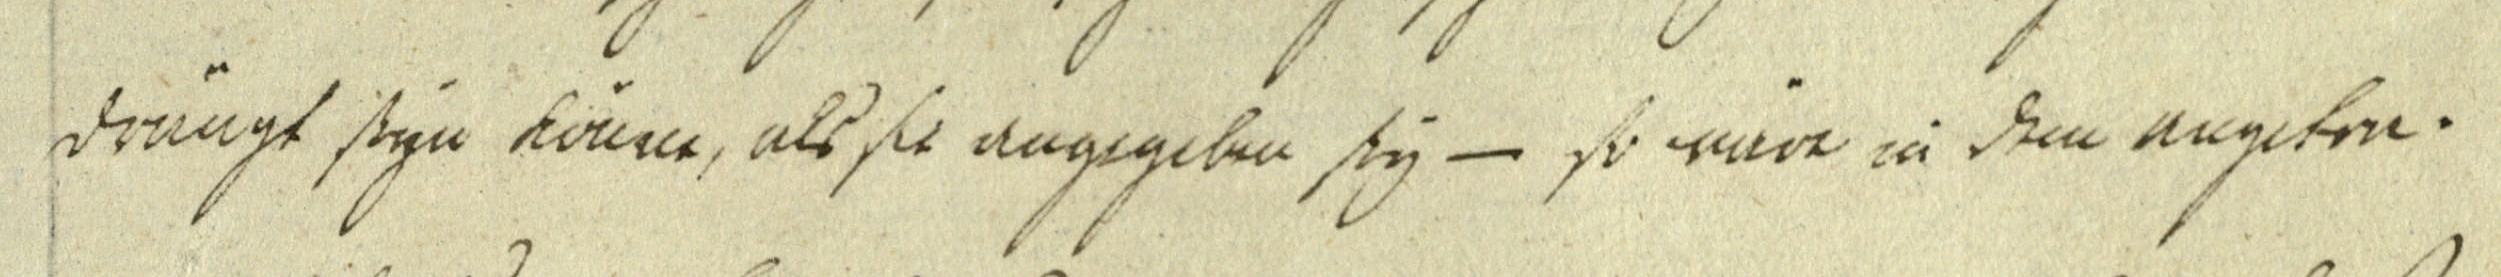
drängt seÿn könne, als sie angegeben seÿ - so wäre in dem angetra¬
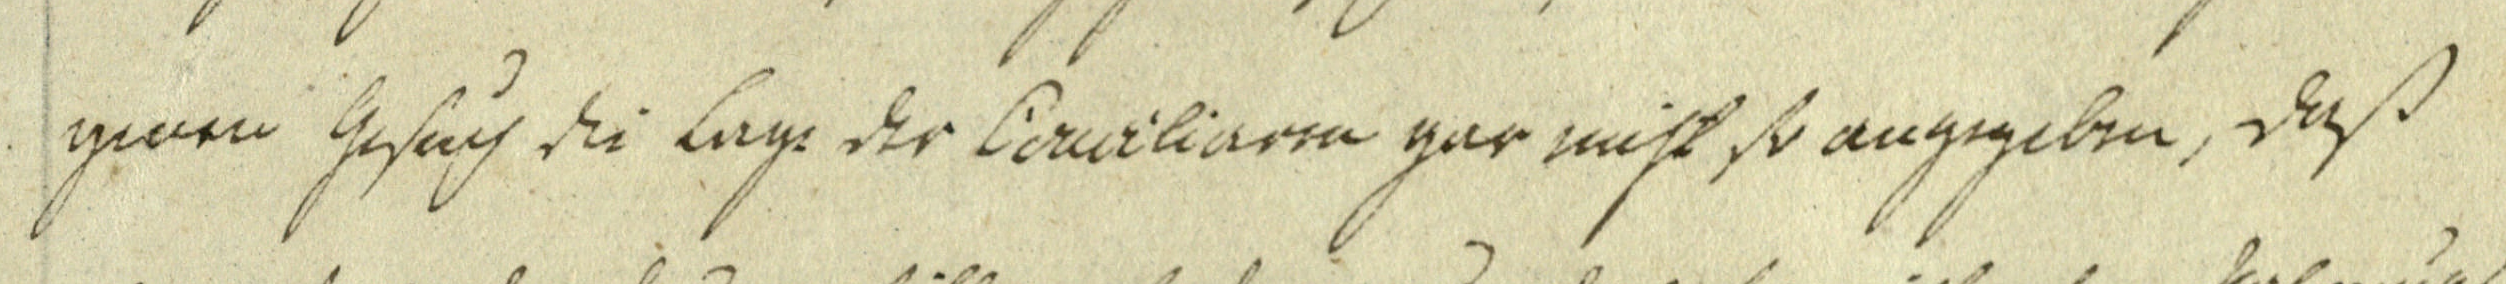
genen Gesuch die Lage der Conciliaren gar nicht so angegeben, daß
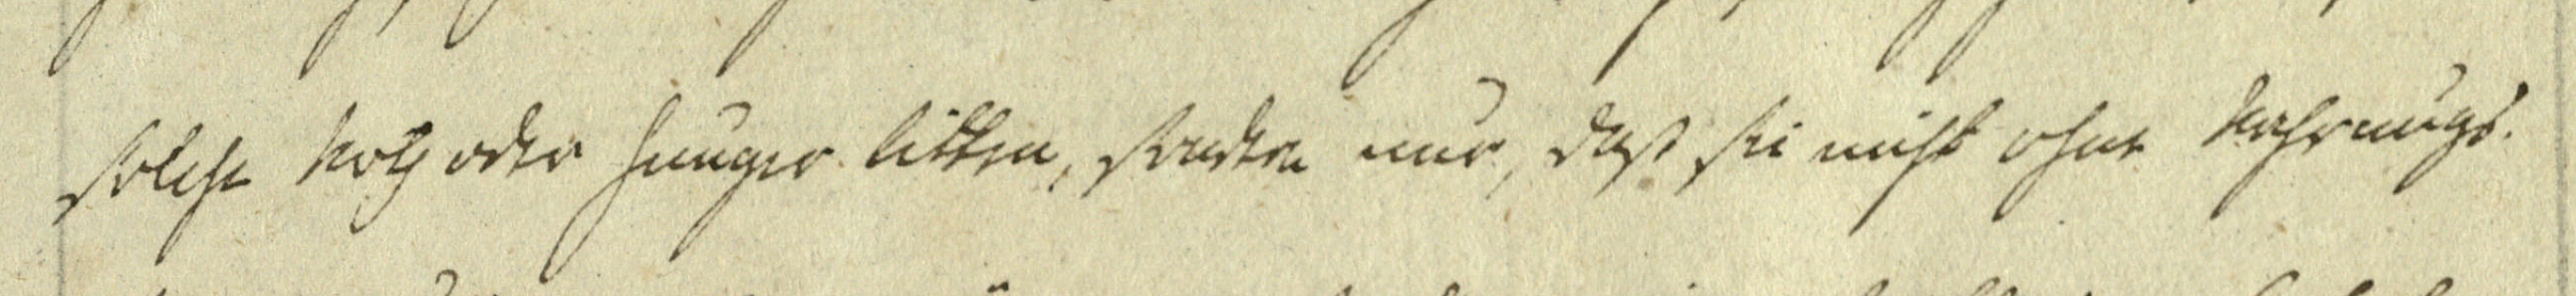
solche Noth oder Hunger litten, sondern nur, daß sie nicht ohne Nahrungs¬
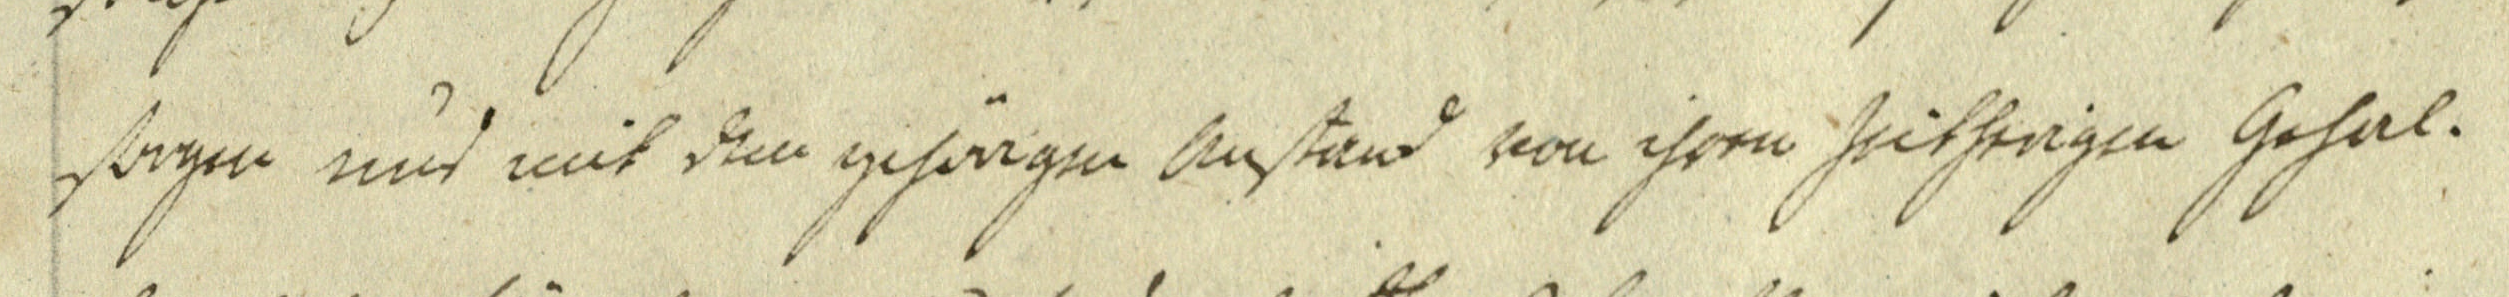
sorgen und mit dem gehörigen Anstand von ihren zeitherigen Gehal¬
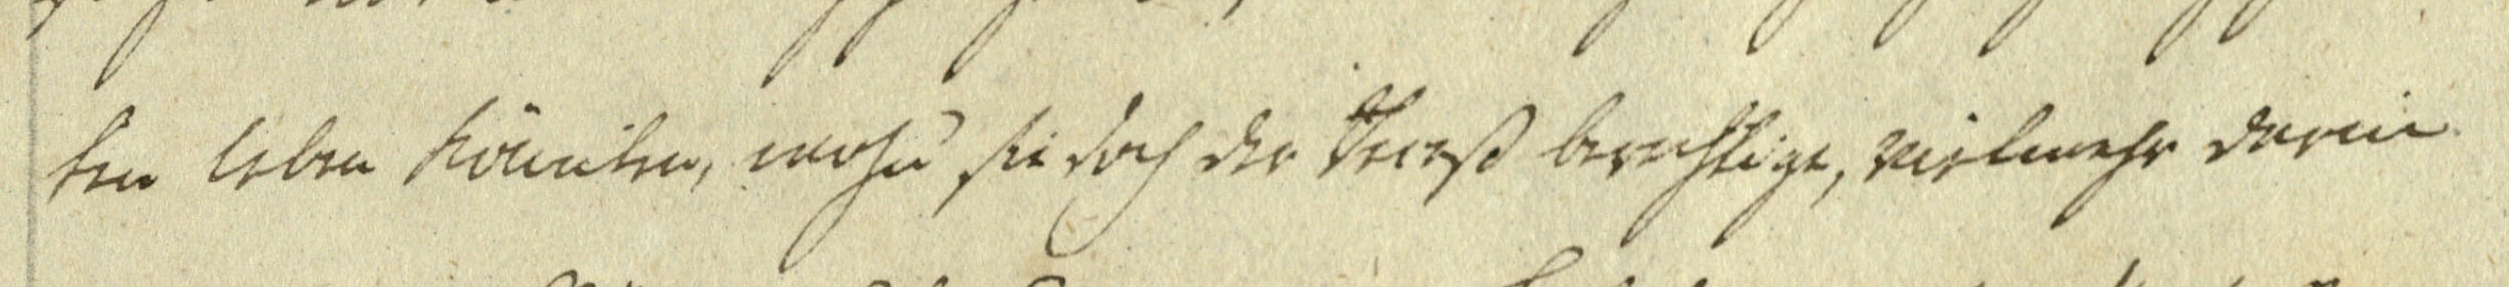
ten leben könnten, wozu sie doch der Receß berechtige, vielmehr darin
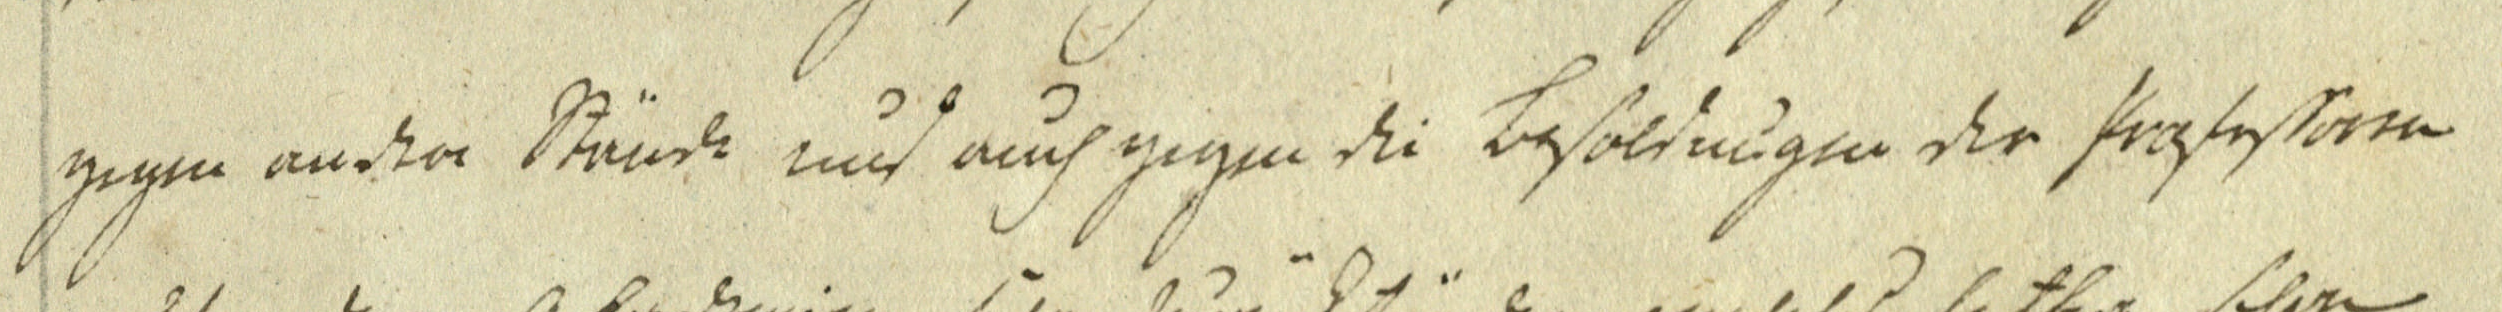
gegen andere Stände und auch gegen die Besoldungen der Professoren
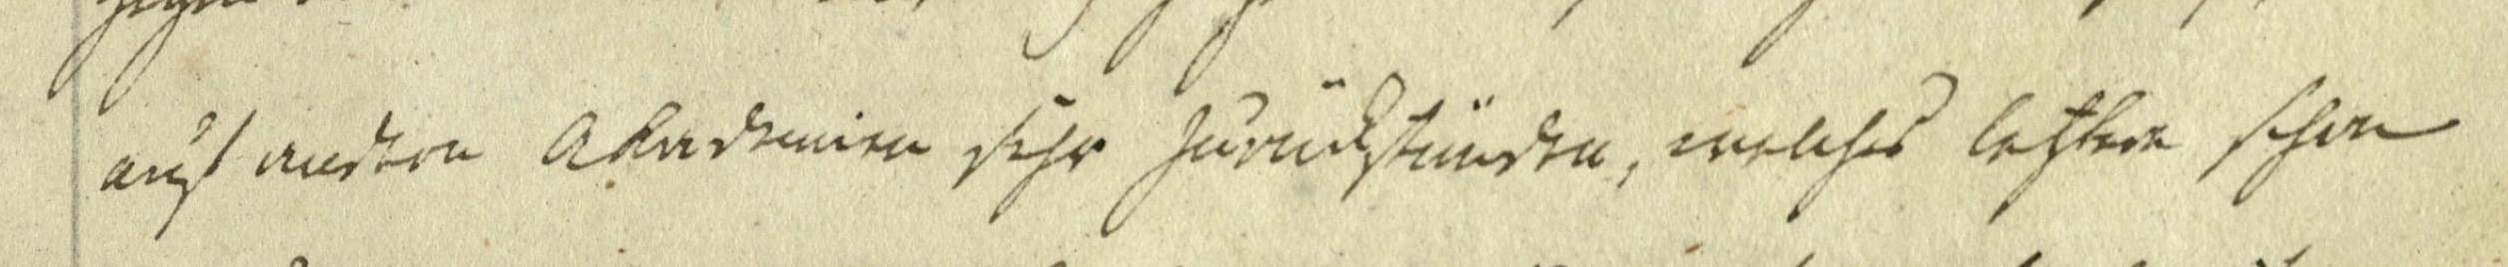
auf andern Akademien sehr zuückstünden, welches letztere schon
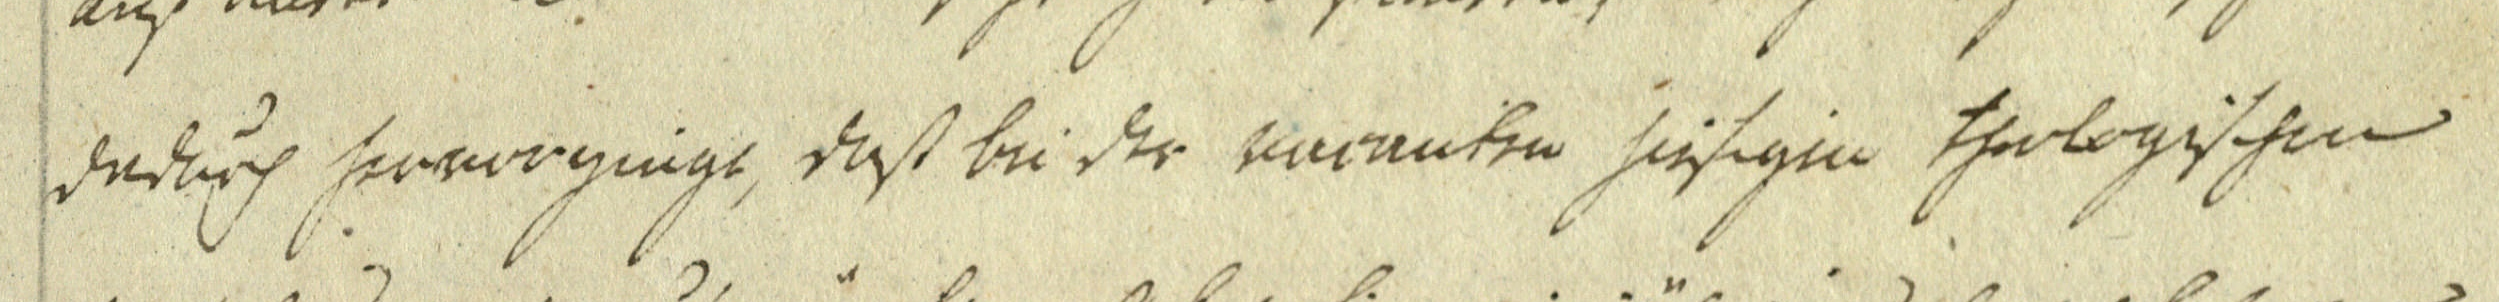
dadurch hervorginge, daß bei der vacanten hiesigen theologischen
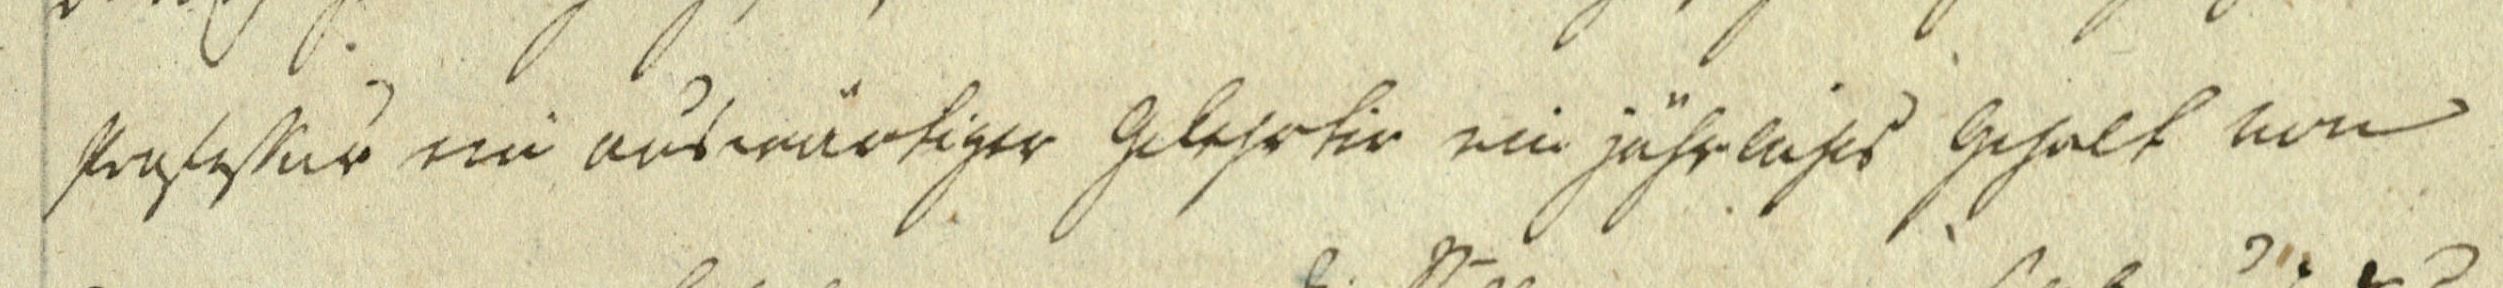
Professur ein auswärtiger Gelehrter ein jährliches Gehalt von
